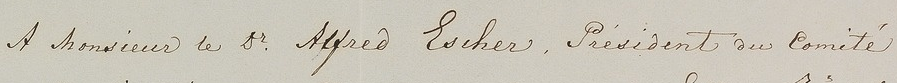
A Monsieur le Dr Alfred Escher, Président du Comité
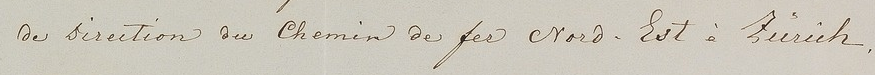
de Direction du Chemin de fer Nord-Est à Zürich.
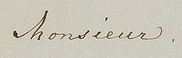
Monsieur.
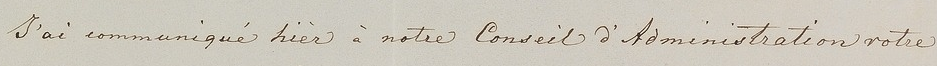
J'ai communiqué hier à notre Conseil d'Administration votre
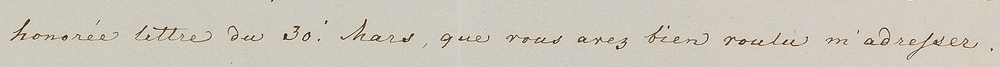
honorée lettre du 30. Mars, que vous avez bien voulu m'adresser.
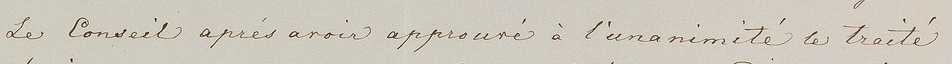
Le Conseil après avoir approuvé à l'unanimité le traité
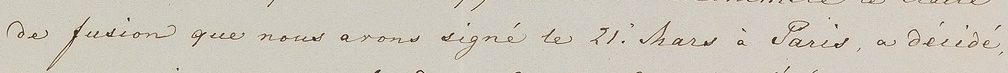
de fusion que nous avons signé le 21. Mars à Paris, a décidé,
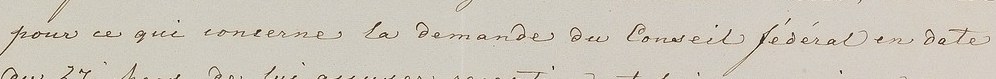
pour ce qui concerne la demande du Conseil fédéral en date
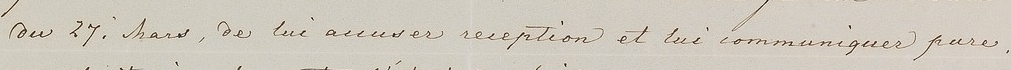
du 27. Mars, de lui accuser reception et lui communiquer pure-
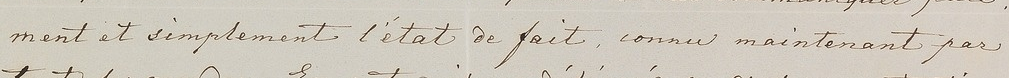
ment et simplement l'état de fait, connu maintenant par
